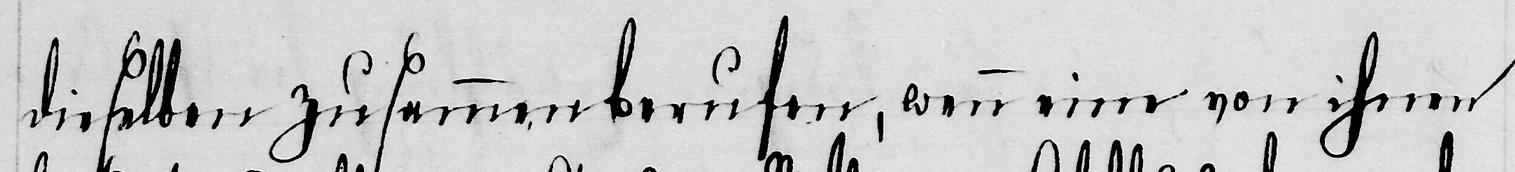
dieselben zusammen berufen, wenn eine von ihnen
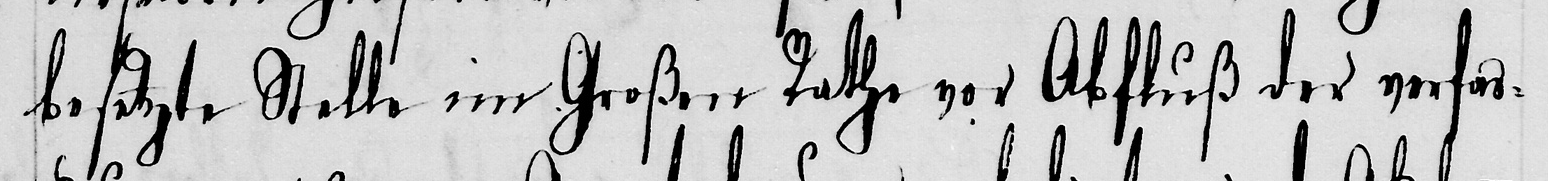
besetze Stelle im Großen Rath vor Abfluß der verfaß¬
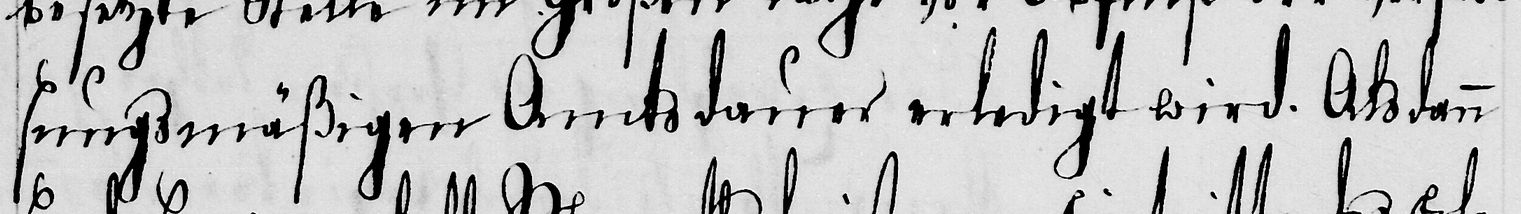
ungsmäßigen Amtsdauer erledigt wird. Alsdann
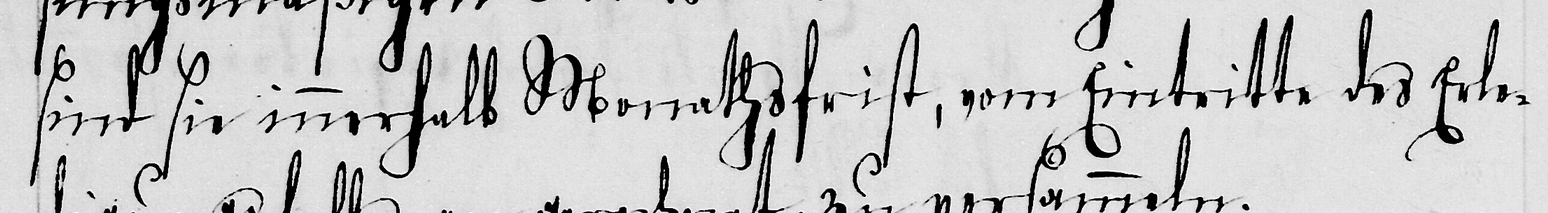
sind sie innerhalb Monathsfrist, vom Eintritte des Erle¬
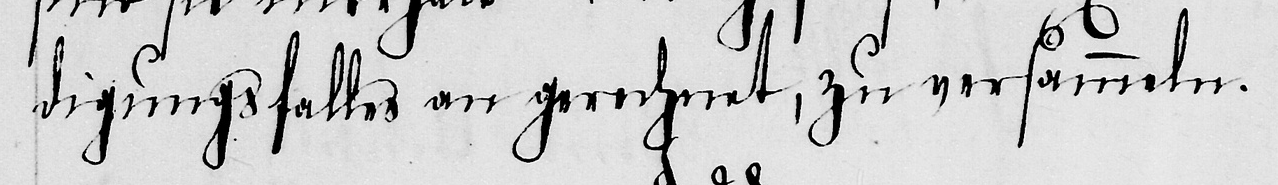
digungsfalles an gerechnet, zu versammeln.
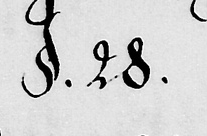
§. 28.
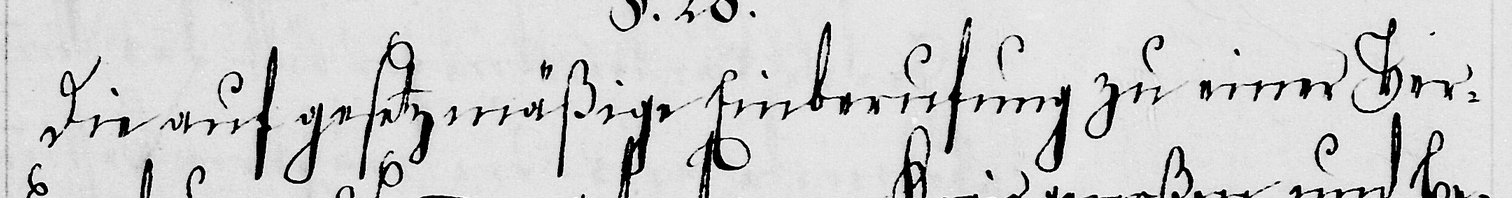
Die auf gesetzmäßige Einberufung zu einer Ver¬
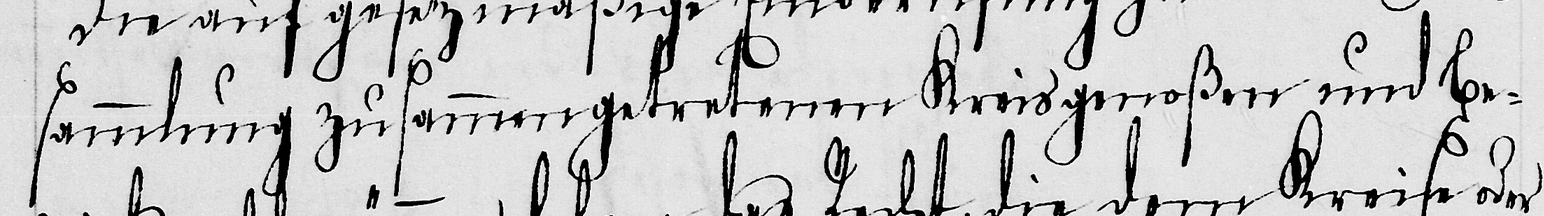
sammlung zusammengetretenen Kreisgenoßen und Be¬
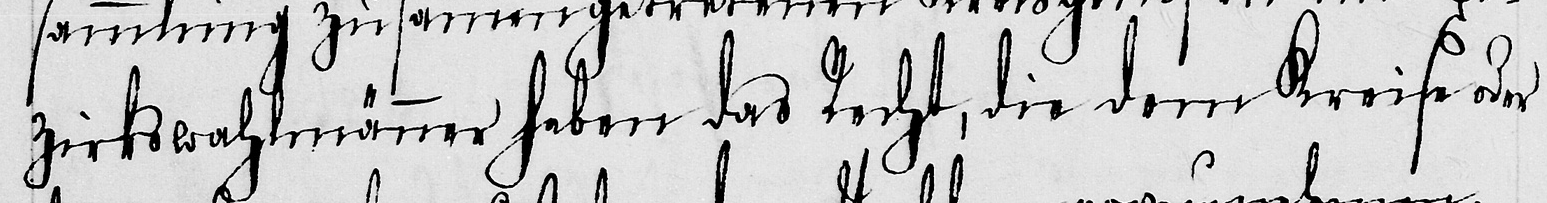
zirkswahlmänner haben das Recht, die dem Kreise
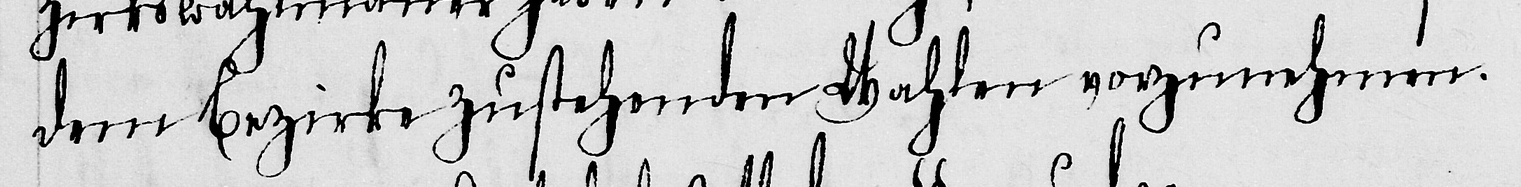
dem Bezirke zustehenden Wahlen vorzunehmen.
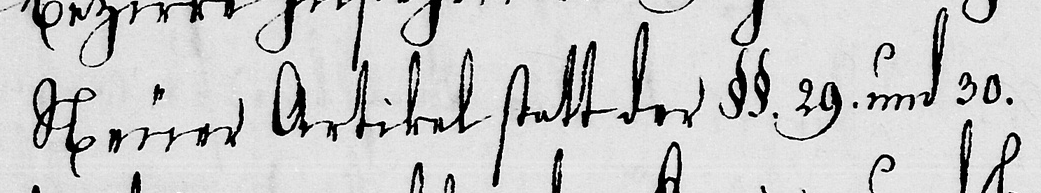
Neuer Artikel statt der §§. 29.
